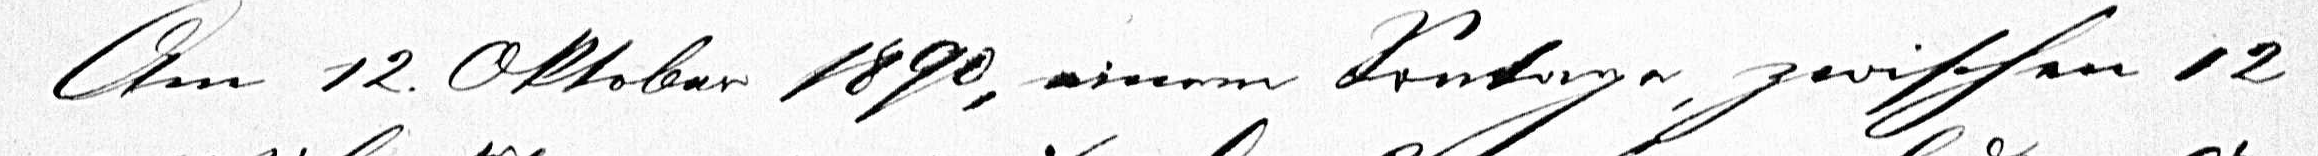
Am 12. Oktober 1890, einem Sontage, zwischen 12
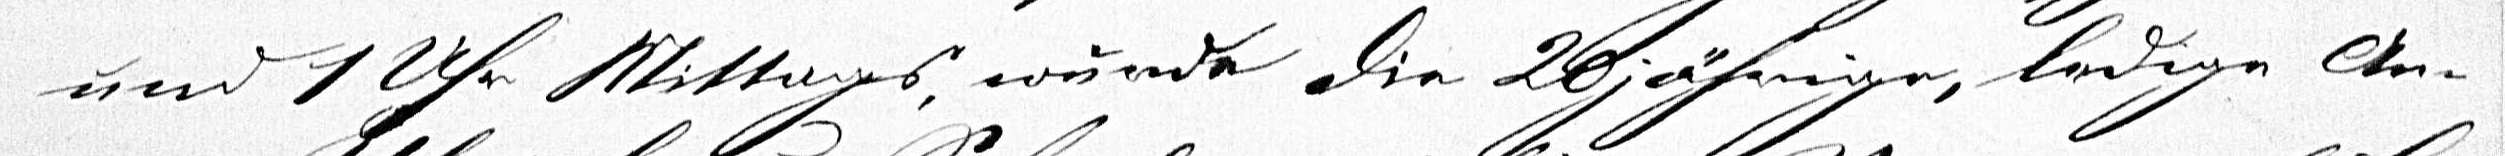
und 1 Uhr Mittags, wurde die 20jährige, ledige An¬
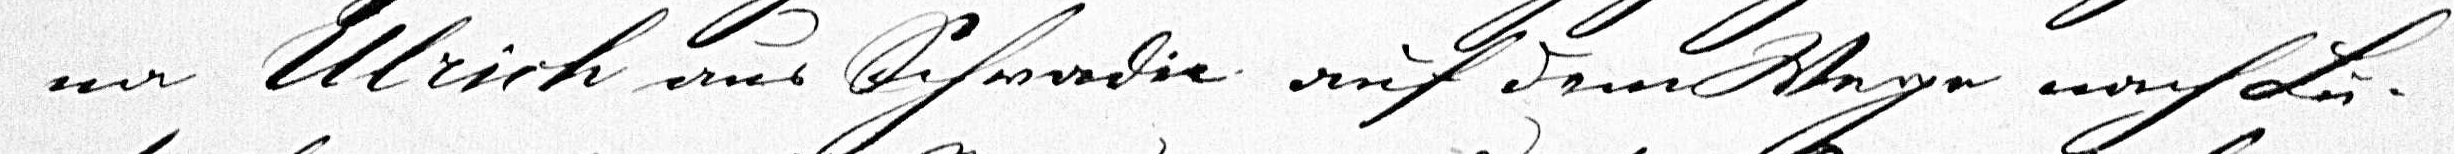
na Ulrich aus Schwadic auf dem Wege nach Lu¬
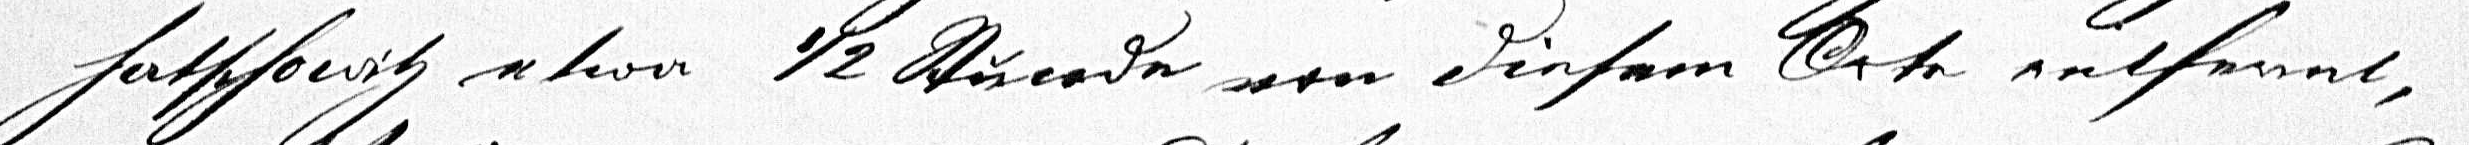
hatschowitz etwa ½ Stunde von diesem Orte entfernt,
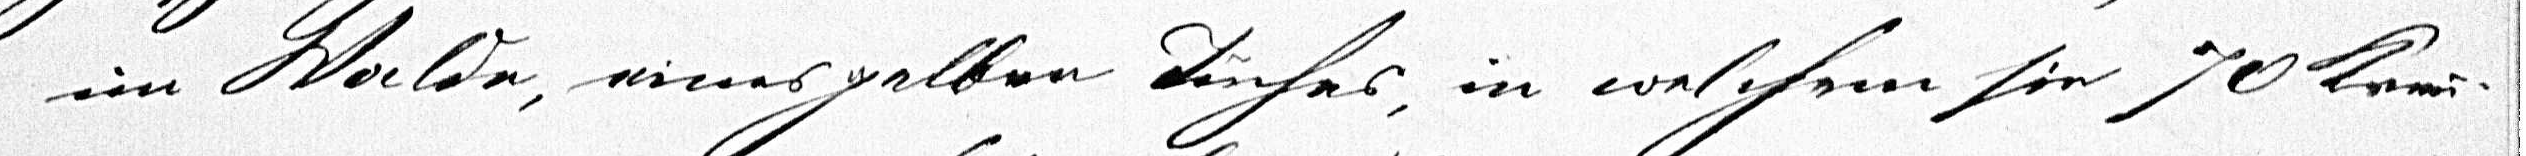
im Walde, eines gelben Tuches, in welchem sie 70 Kreu¬
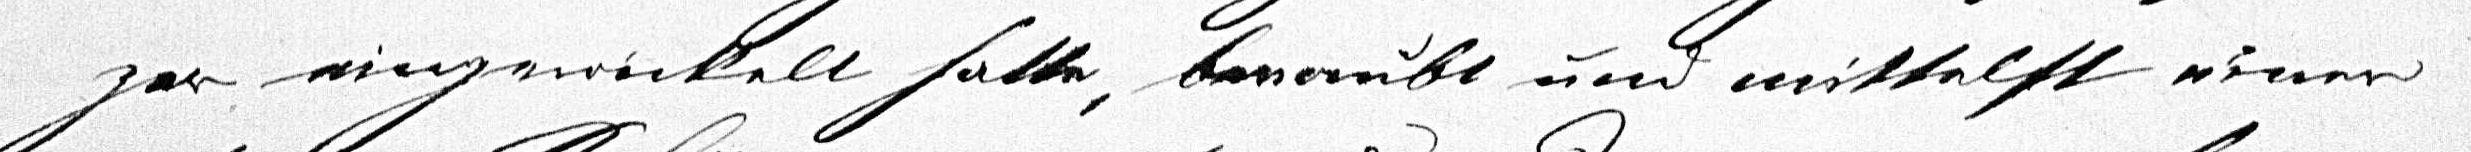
zer eingewickelt hatte, beraubt und mittelst einen
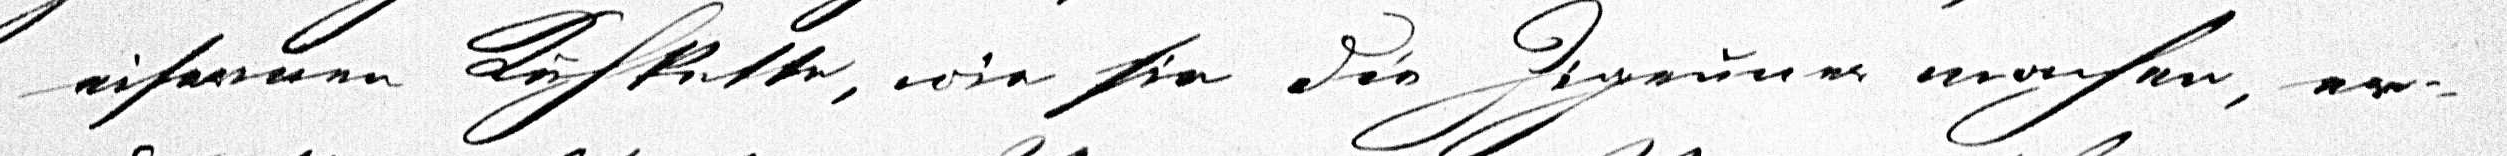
eisernen Kuhkette, wie sie die Zigeuner machen, er¬
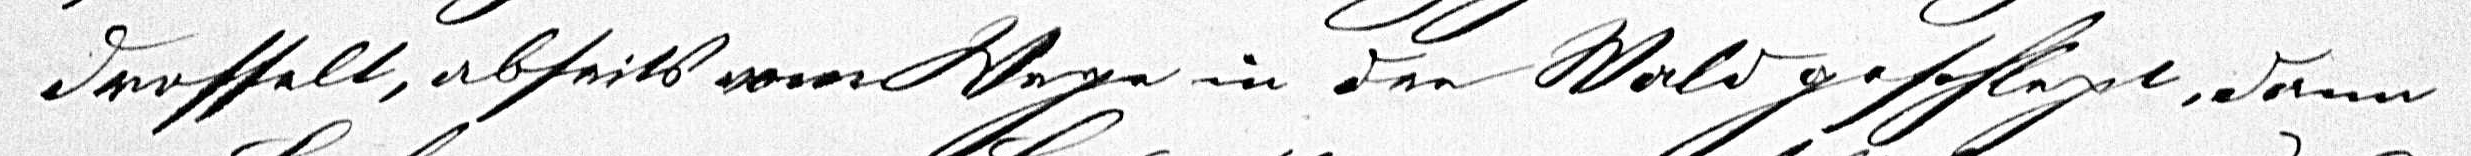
drosselt, abseits am Wege in den Wald geschleppt, dann
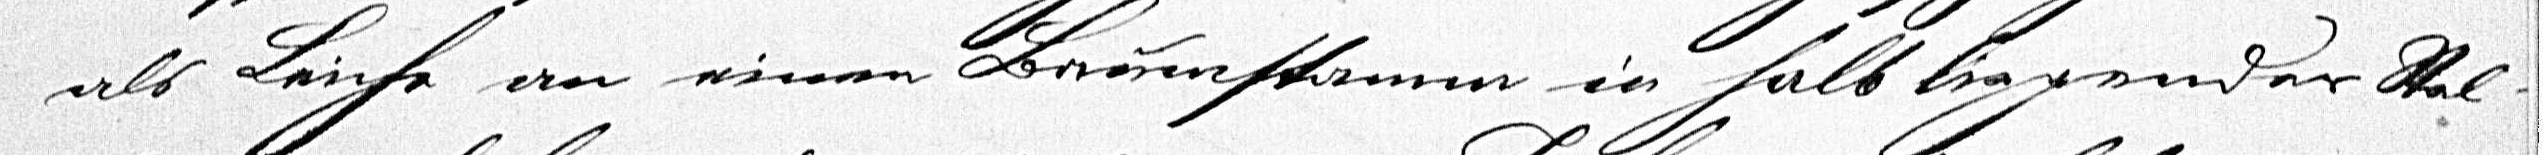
als Leiche an einen Baumstamm in halbliegender Stel¬
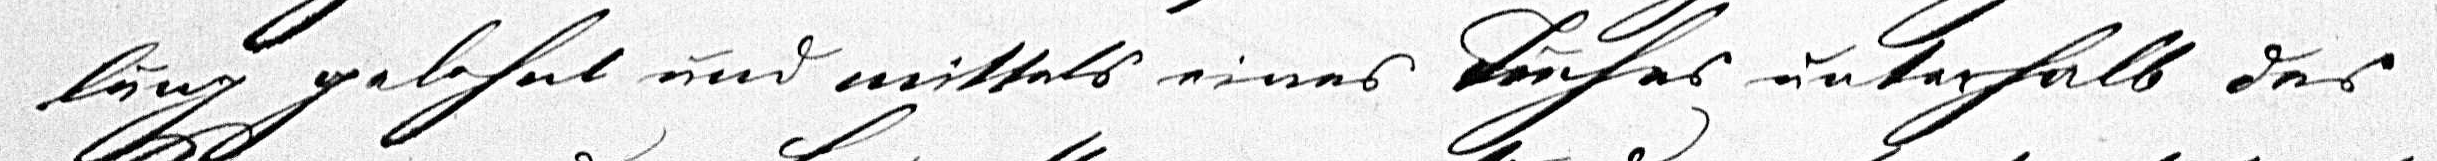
lung gelehnt und mittels eines Tuches unterhalb des
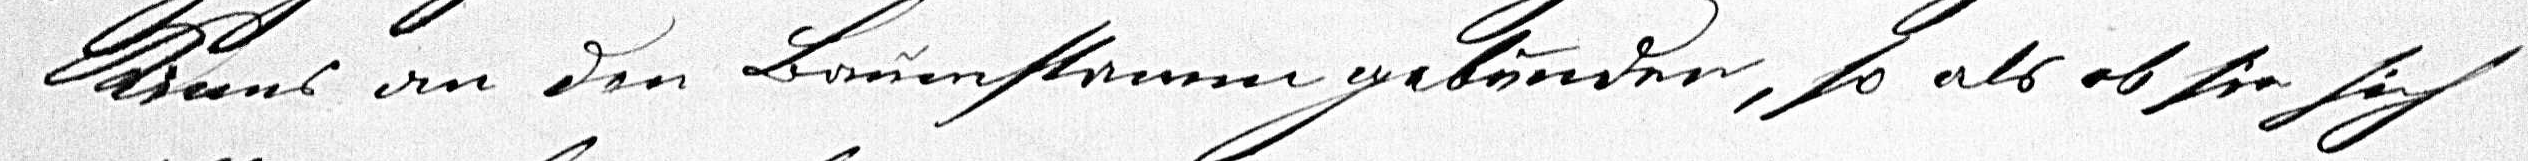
Kinns an den Baumstamm gebunden, so als ob sie sich
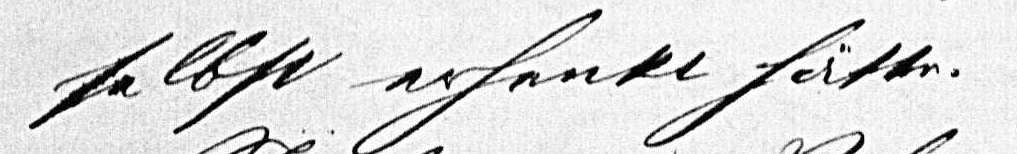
selbst erhenkt hätte.
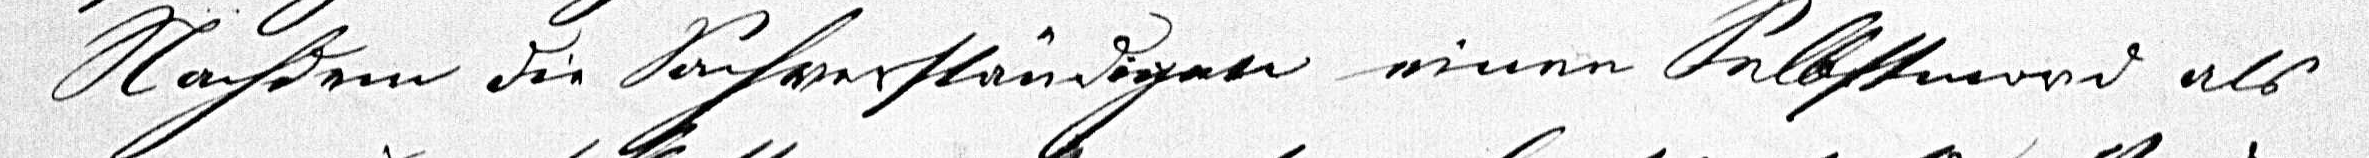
Nachdem die Sachverständigen einen Selbstmord als
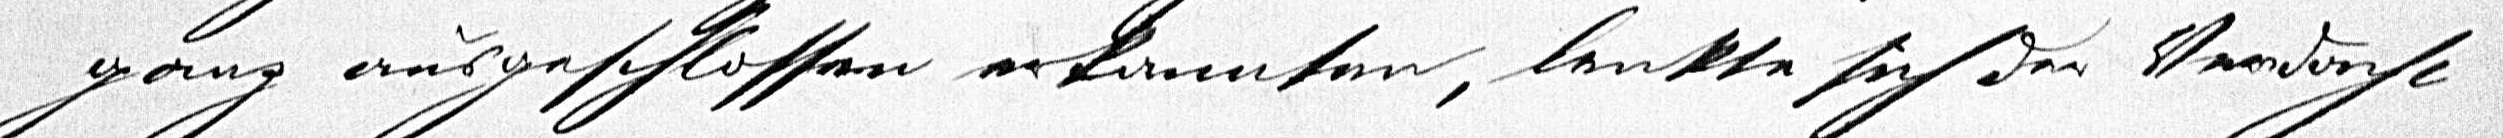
ganz ausgeschlossen erkannten, lenkte sich der Verdacht
